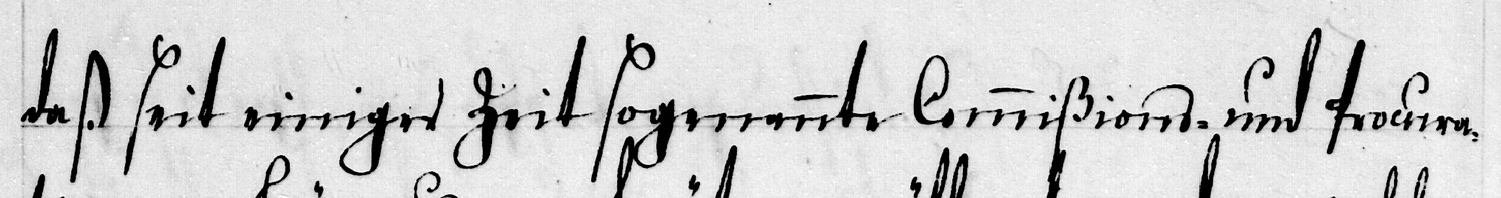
daß seit einiger Zeit sogenannte Commißions- und Procura¬
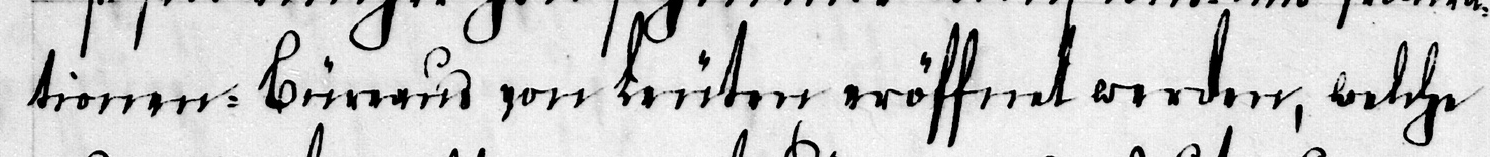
tionen-Büreaus von Leuten eröffnet werden, welche
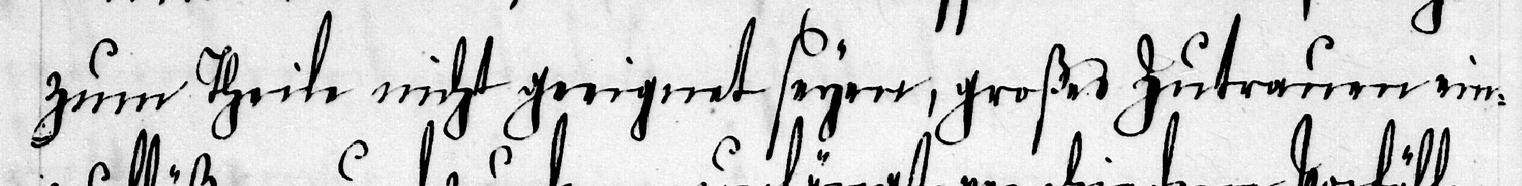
zum Theile nicht geeignet seyen, großes Zutrauen ein¬
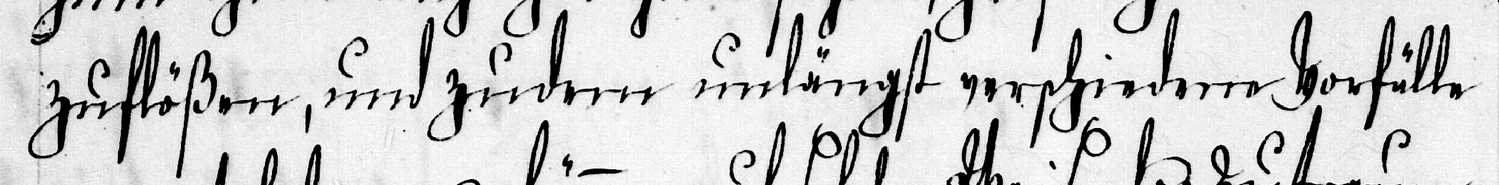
zuflößen, und zudem unlängst verschiedene Vorfälle
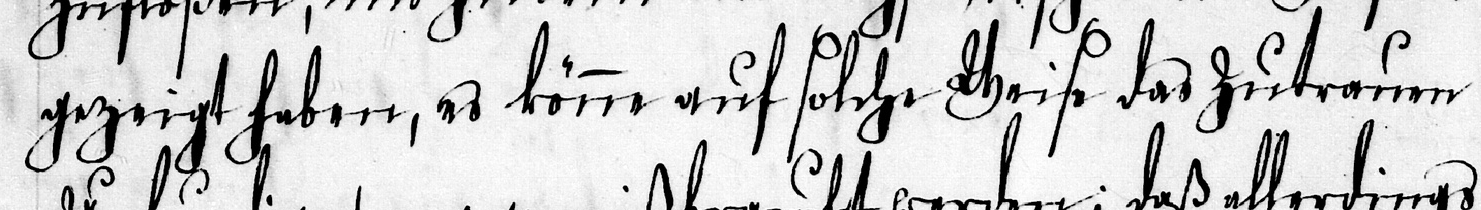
gezeigt haben, es könne auf solche Weise das Zutrauen
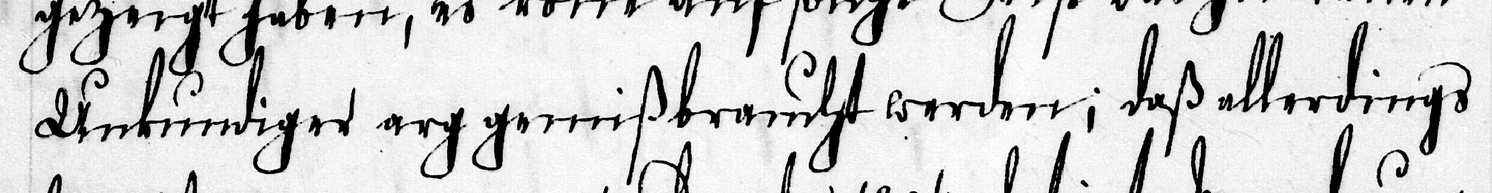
Unkundiger arg gemißbraucht werden; daß allerdings
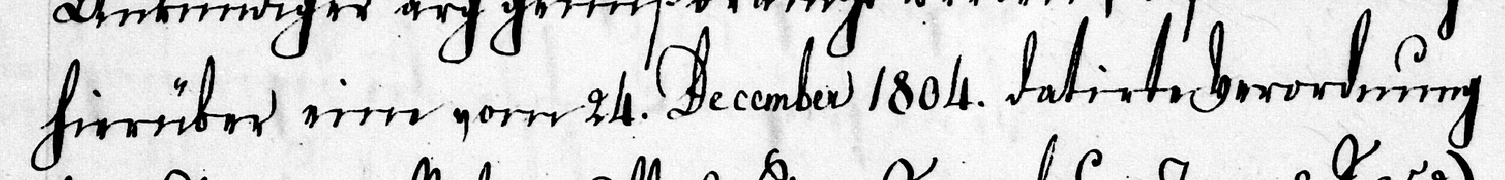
hierüber eine vom 24. December 1804. datirte Verordnung
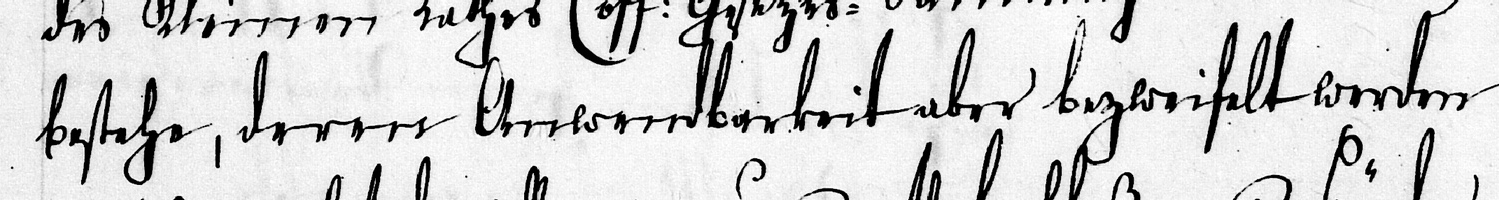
bestehe, deren Anwendbarkeit aber bezweifelt werden
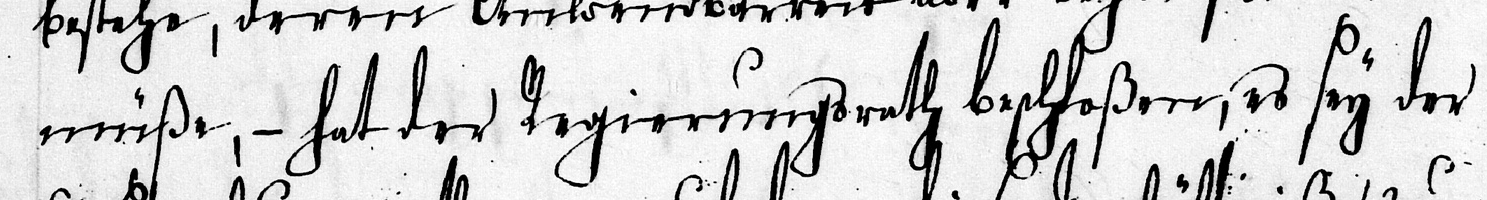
müße, – hat der Regierungsrath beschloßen, es sey der
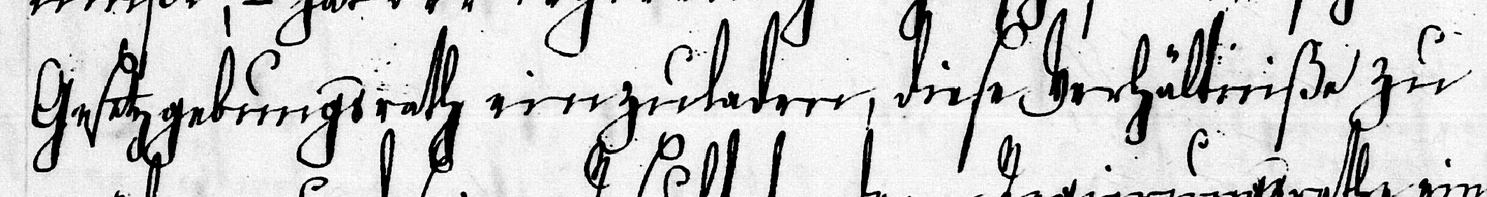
Gesetzgebungsrath einzuladen, diese Verhältniße zu
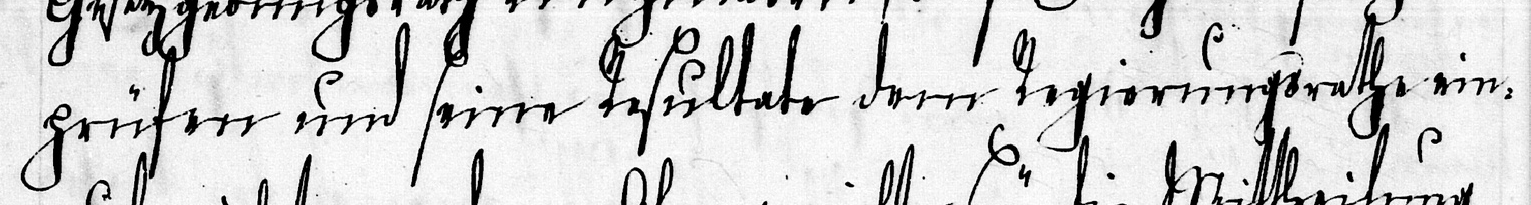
prüfen und seine Resultate dem Regierungsrathe ein¬
